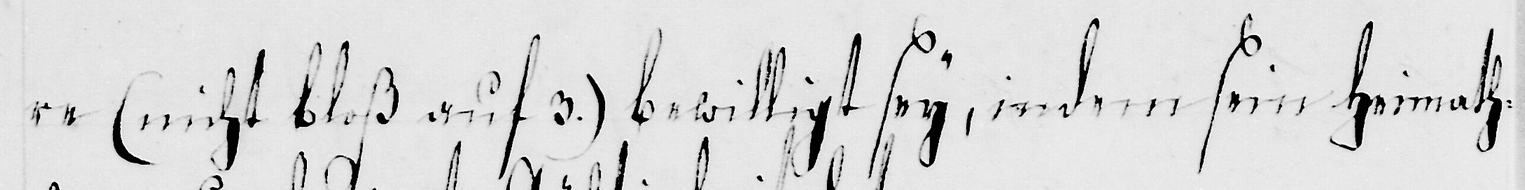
re (nicht bloß auf 3.) bewilligt sey, indem sein Heimath¬
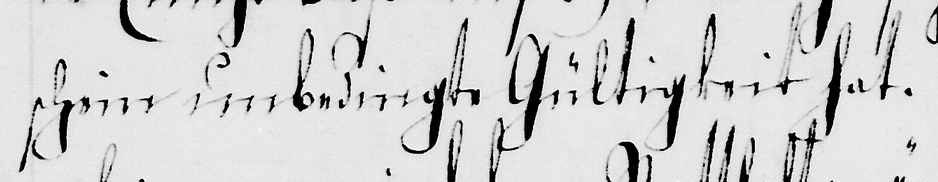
schein unbedingte Gültigkeit hat.
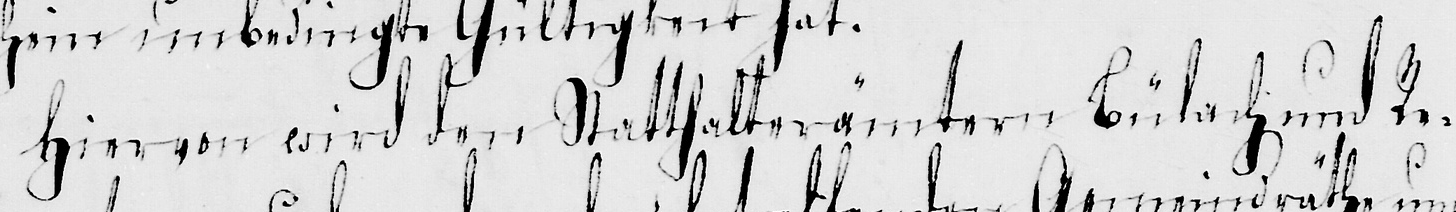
Hiervon wird den Statthalterämtern Bülach und Re¬
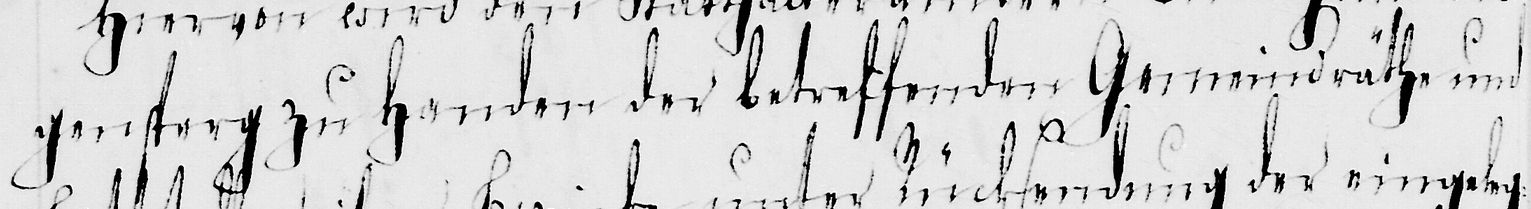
gensperg zu Handen der betreffenden Gemeindräthe und
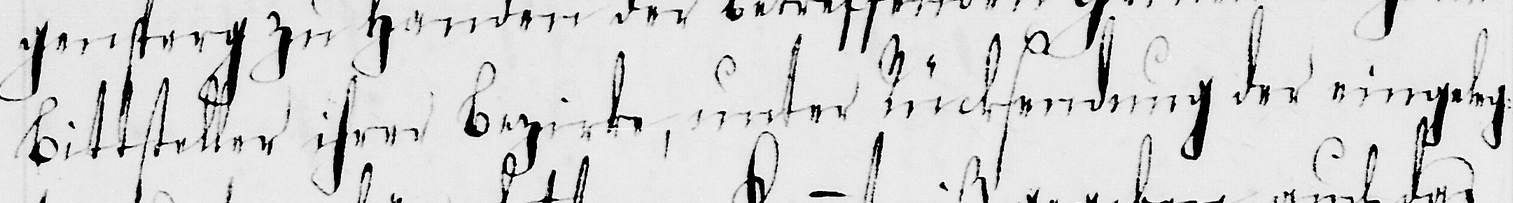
Bittsteller ihrer Bezirke, unter Rücksendung der eingele¬
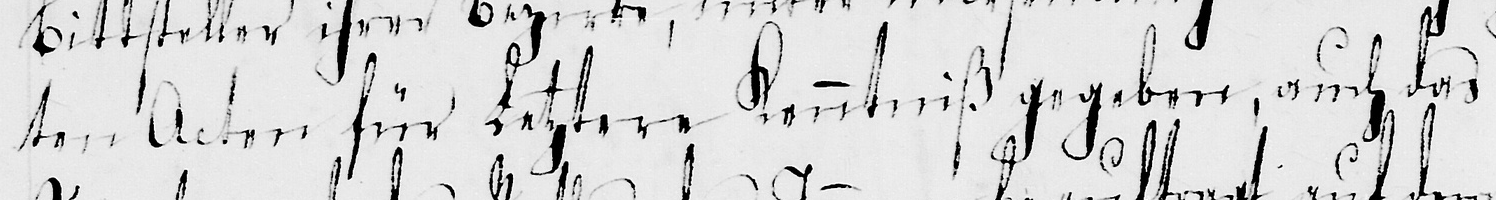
gten Acten für Letztere Kenntniß gegeben, auch das
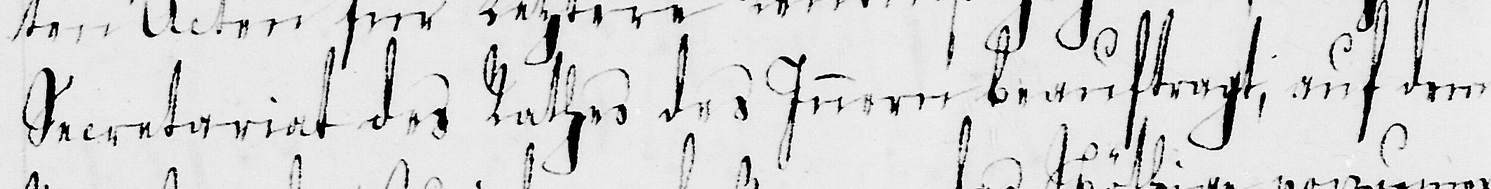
Secretariat des Rathes des Innern beauftragt, auf dem
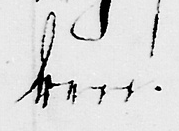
ken.
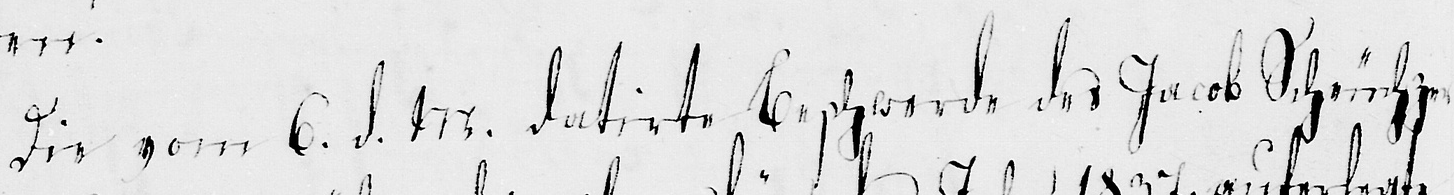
Die vom 6 d. M. datirte Beschwerde des Jacob Scheuchzer
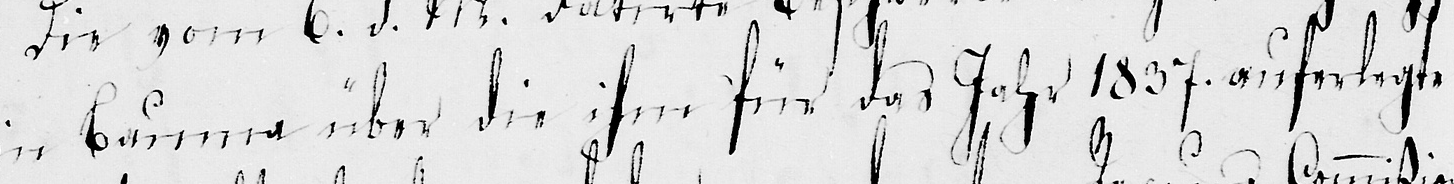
in Bauma über die ihm für das Jahr 1837. auferlegte
